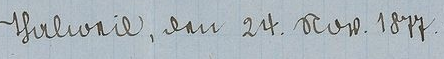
Thalweil, den 24. Nov. 1877.
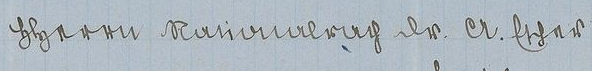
HHerrn Nationalrath Dr. A. Escher
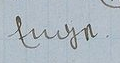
Enge.
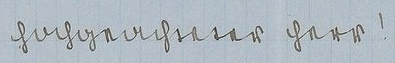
Hochgeachteter Herr!
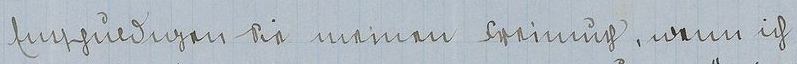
Entschuldigen Sie meinen Freimuth, wenn ich
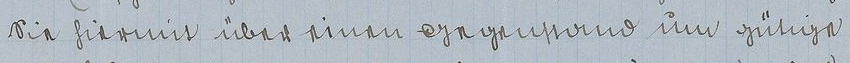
Sie hiermit über einen Gegenstand um gütige
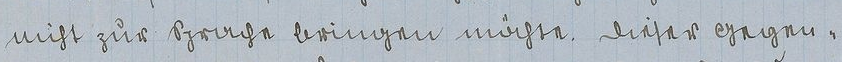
nicht zur Sprache bringen möchte. Dieser Gegen-
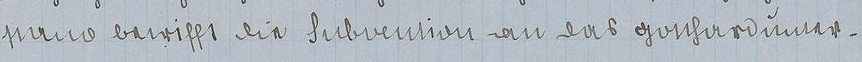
stand betrifft die Subvention an das Gotthardunter-
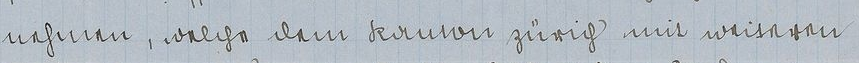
nehmen, welche dem Kanton Zürich mit weiteren
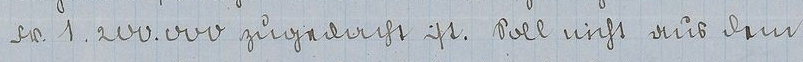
Fr. 1.200.000 zugedacht ist. Soll nicht aus dem
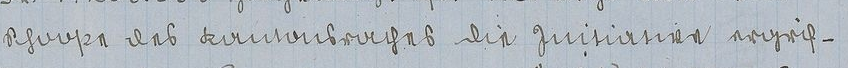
Schooße des Kantonsrathes die Initiative ergrif-
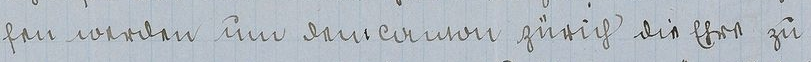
fen werden um dem Canton Zürich die Ehre zu
